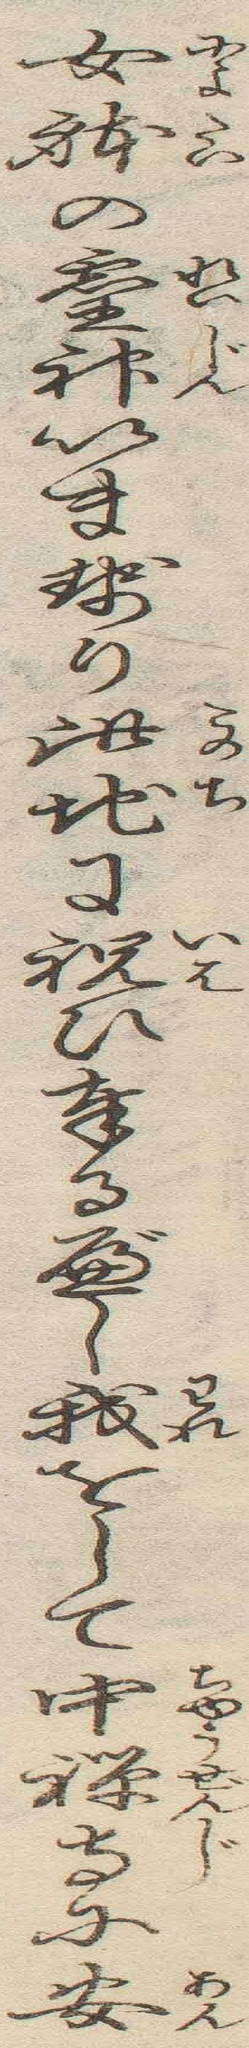女躰の靈神いませり此地に祝ひ奉るべし我をして中禅寺に安
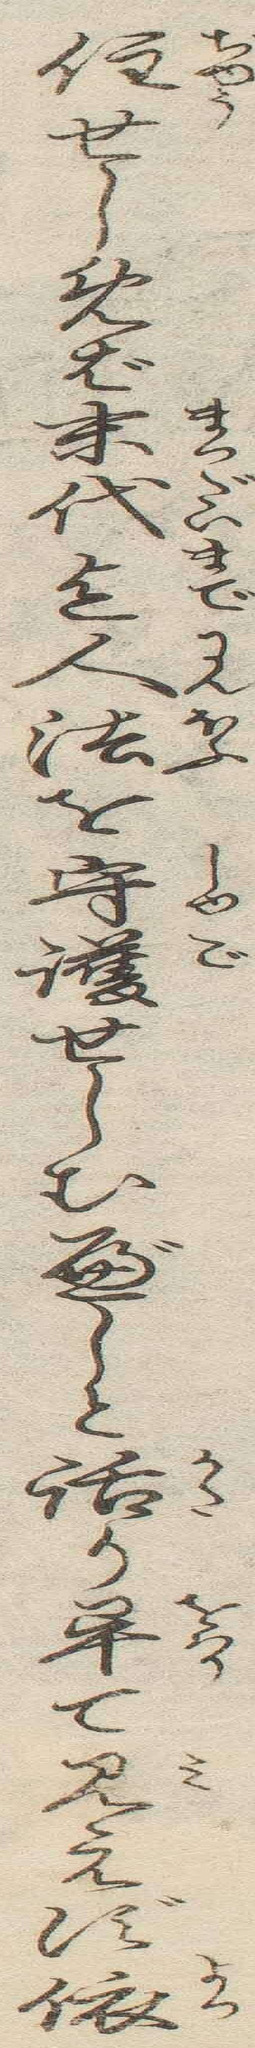住せしめば末代迄人法を守護せしむべしと話り畢て見えず依
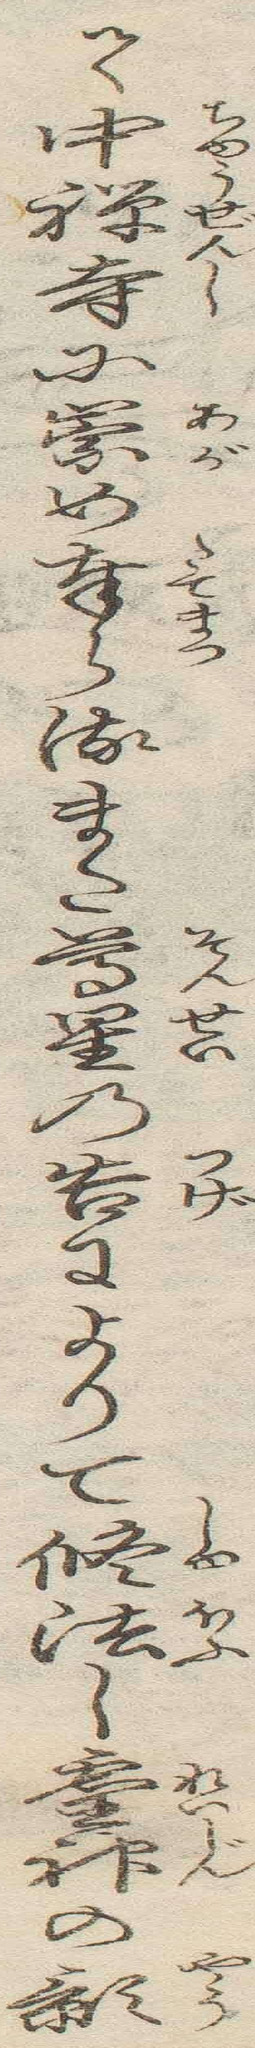て中禅寺に崇め奉らるまた尊星の告によりて修法し靈神の影
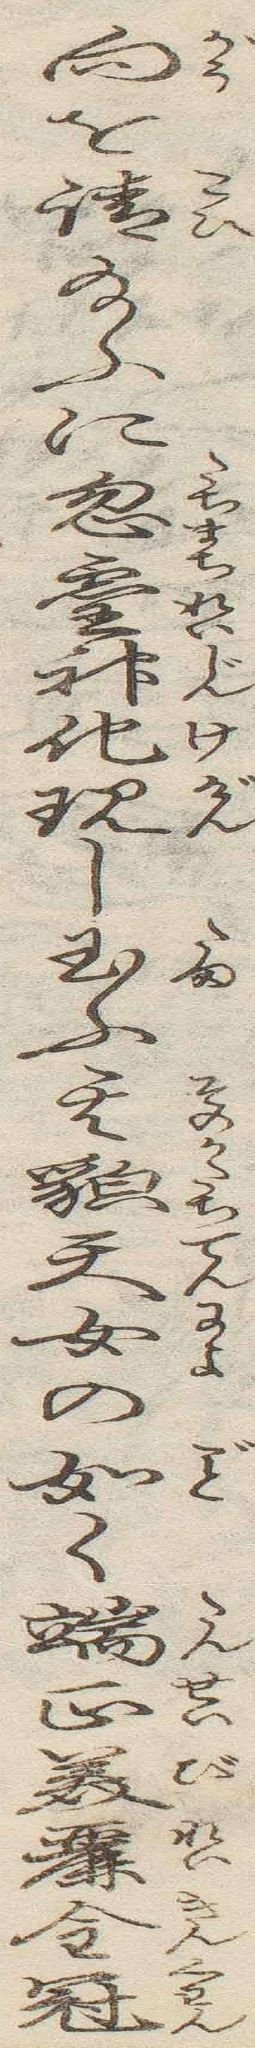向を請給ふに忽靈神化現し玉ふ其貌天女の如く端正美麗金冠
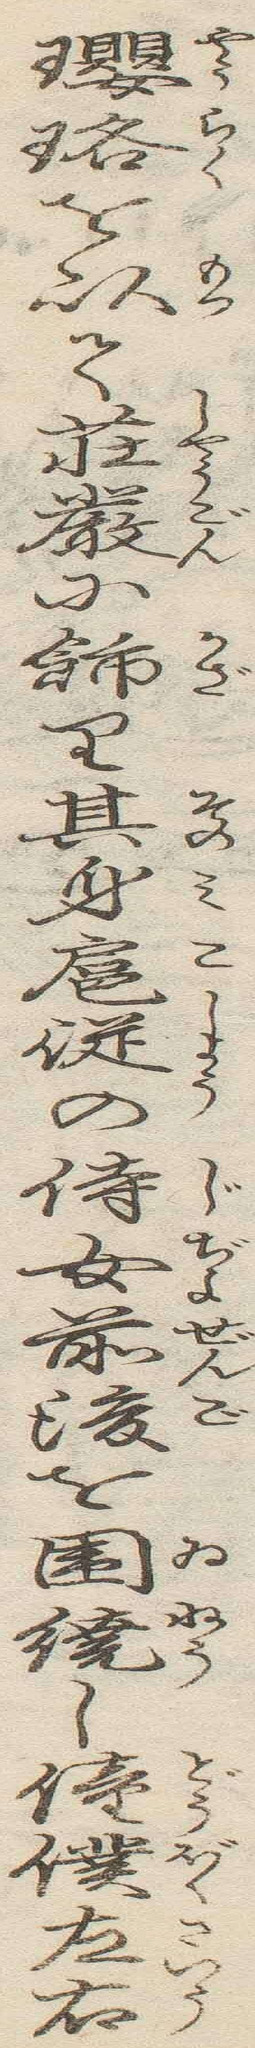瓔珞を以て荘嚴に飾り其身扈従の侍女前後を圍繞し僮僕左右
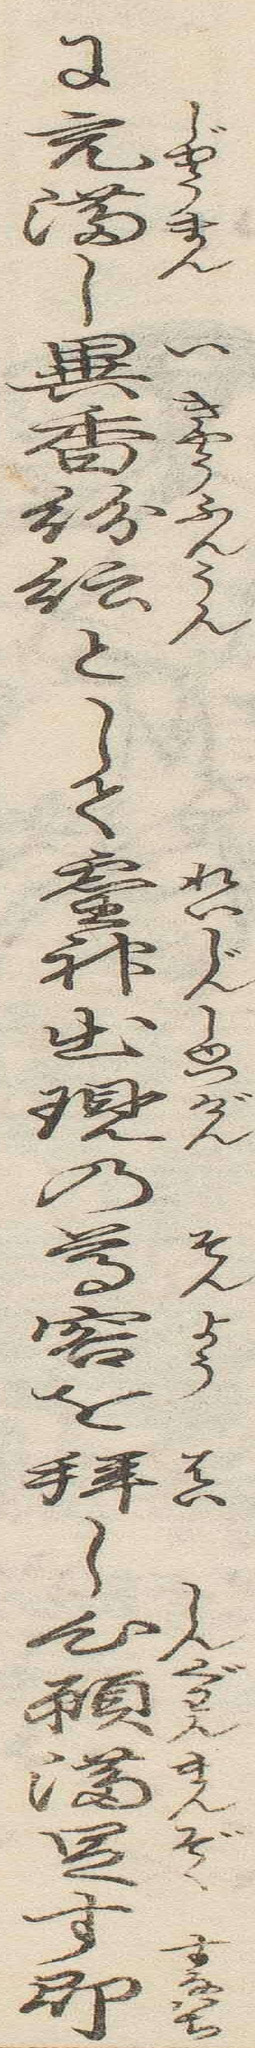に充満し異香紛紜として靈神出現の尊容を拜し心願満足す即
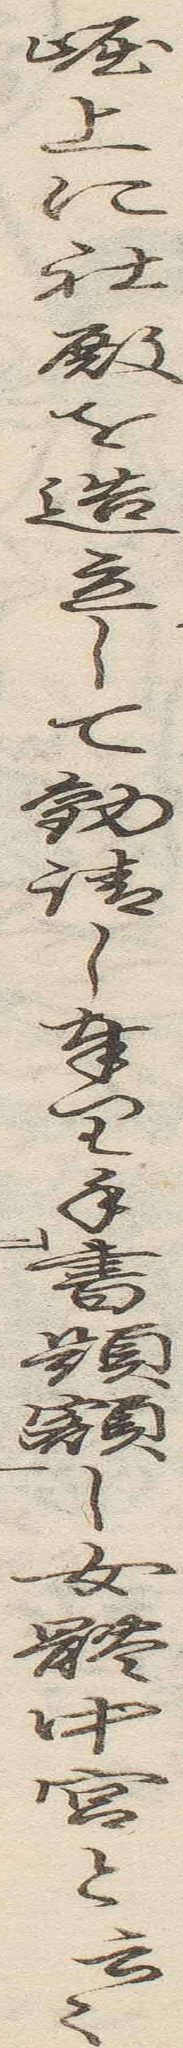崛上に社殿を造立して勸請し奉り手-書題額し女體中宮と云云
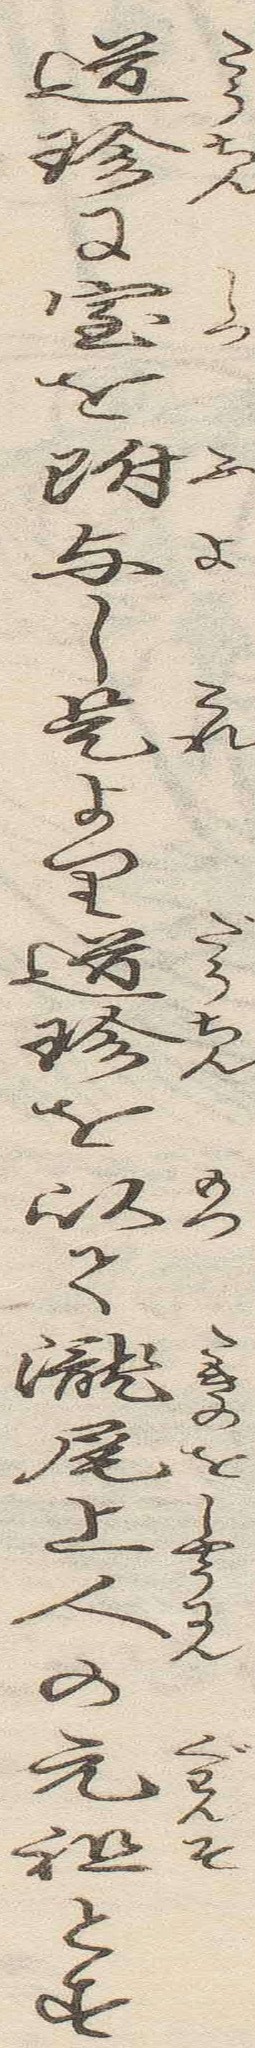道珍に室を附与し是より道珍を以て瀧尾上人の元祖とす
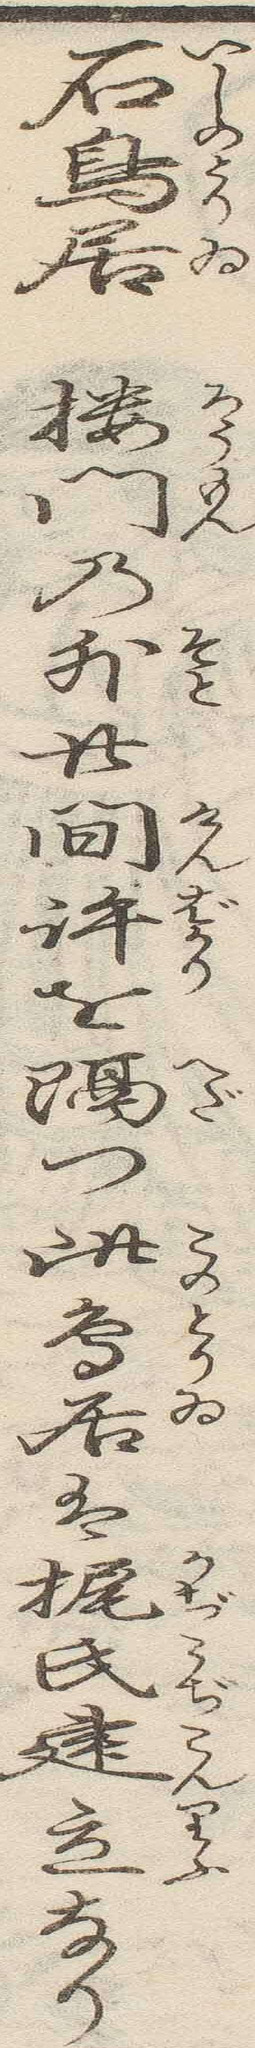石鳥居楼門の外廿間許を隔つ此鳥居は梶氏建立なり
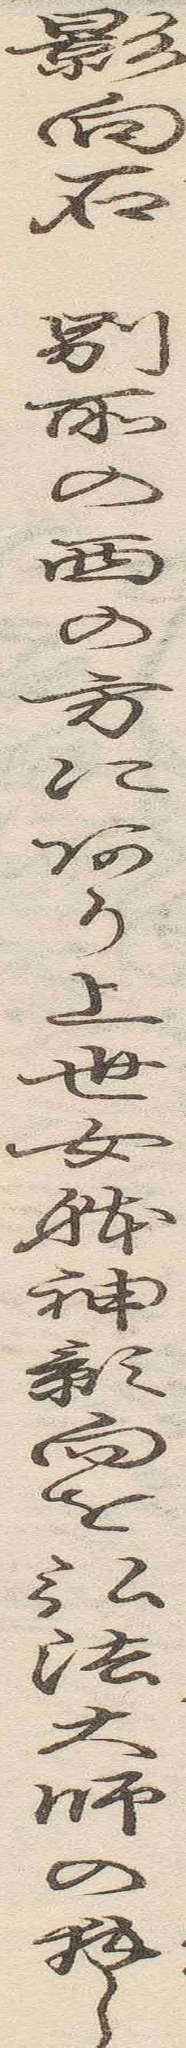影向石別所の西の方にあり上世女躰神影向を弘法大師の拜し
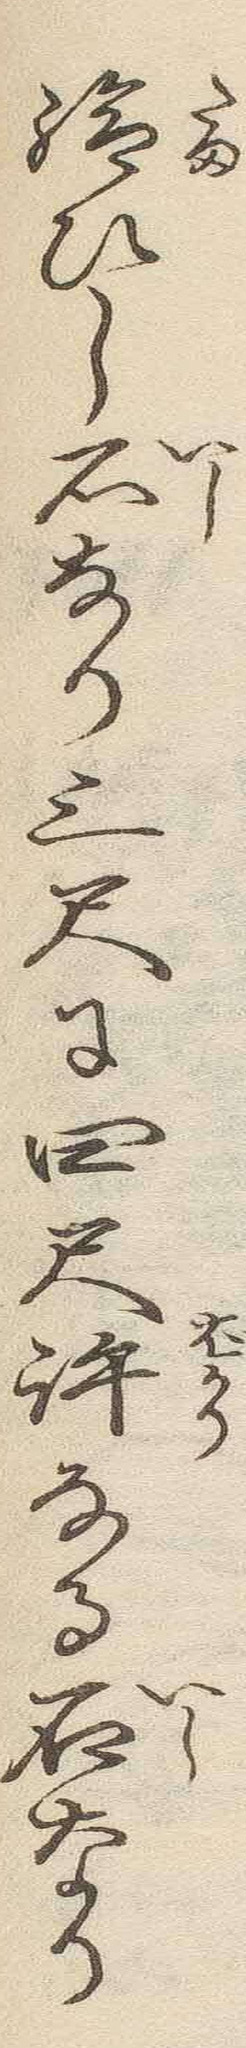給ひし石なり三尺に四尺許なる石なり
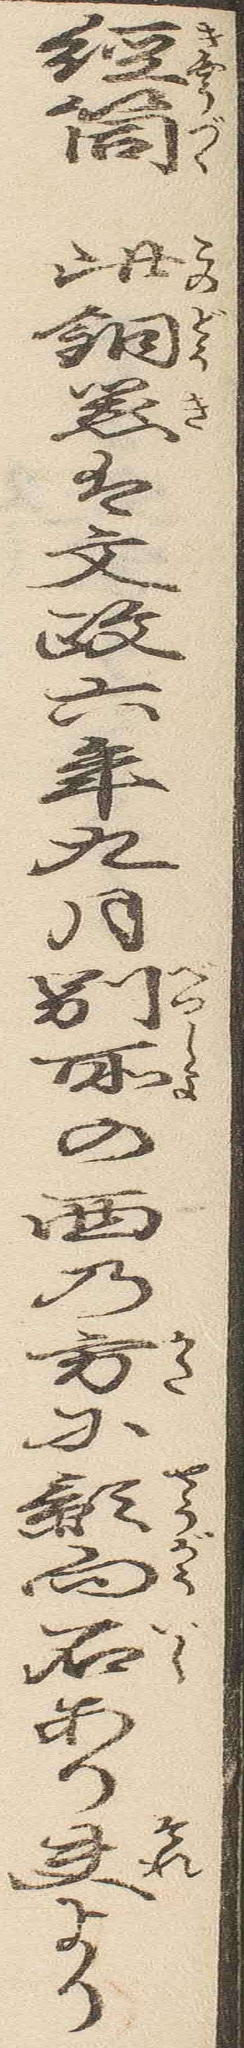經筒此銅器は文政六年九月別所の西の方に影向石あり夫より
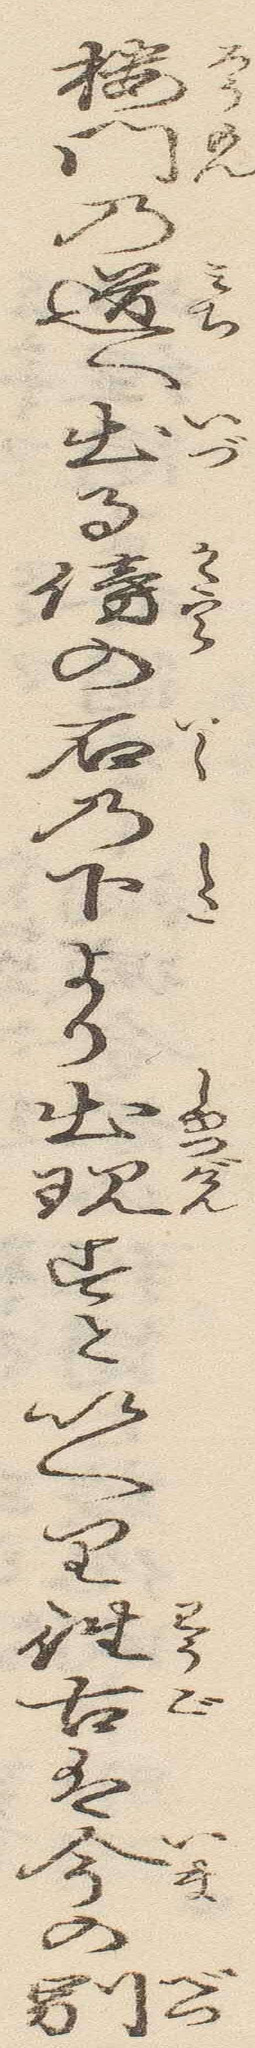楼門の道へ出る傍の石の下より出現すといへり徃古は今の別
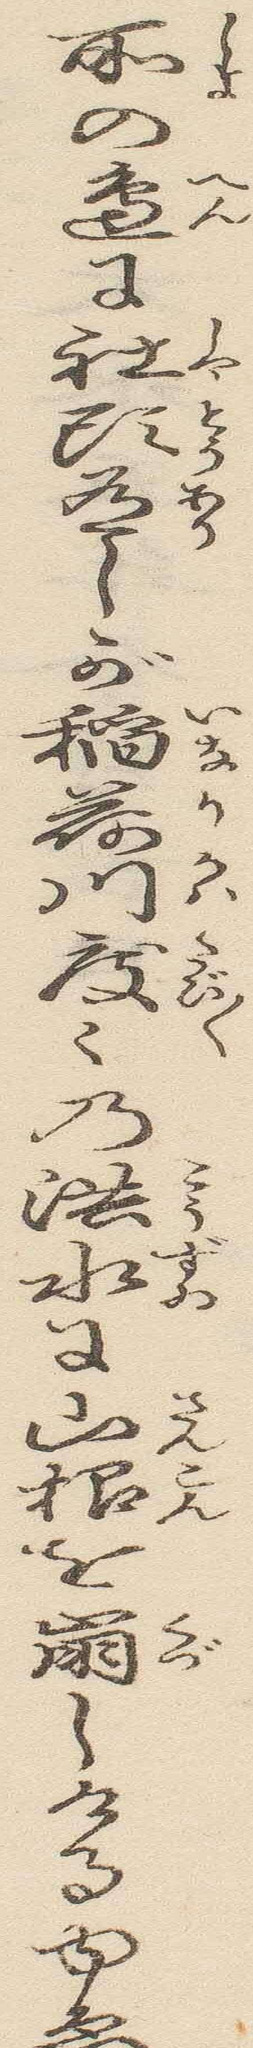所の邊に社頭有しが稲荷川度〻の洪水に山根を崩しけるゆゑ
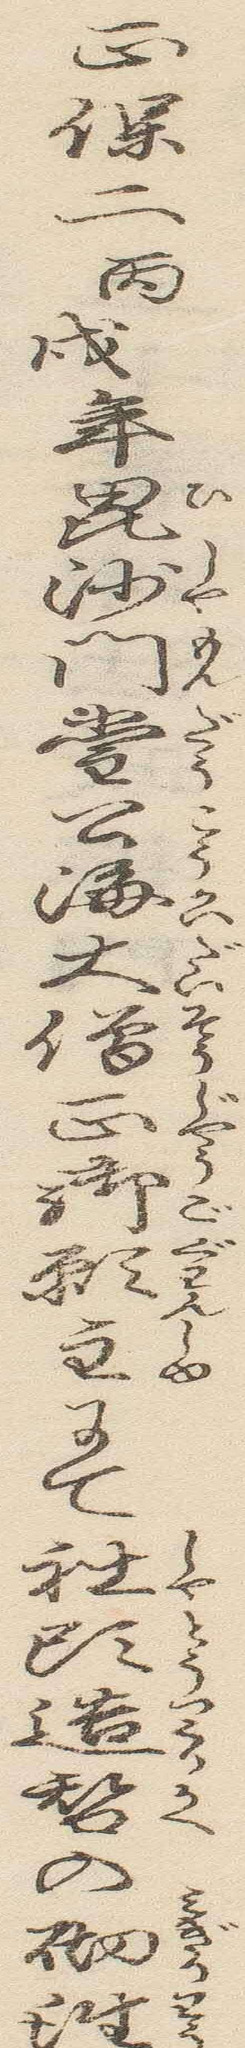正保二丙戌年毘沙門堂公海大僧正御願主にて社頭造替の砌徃
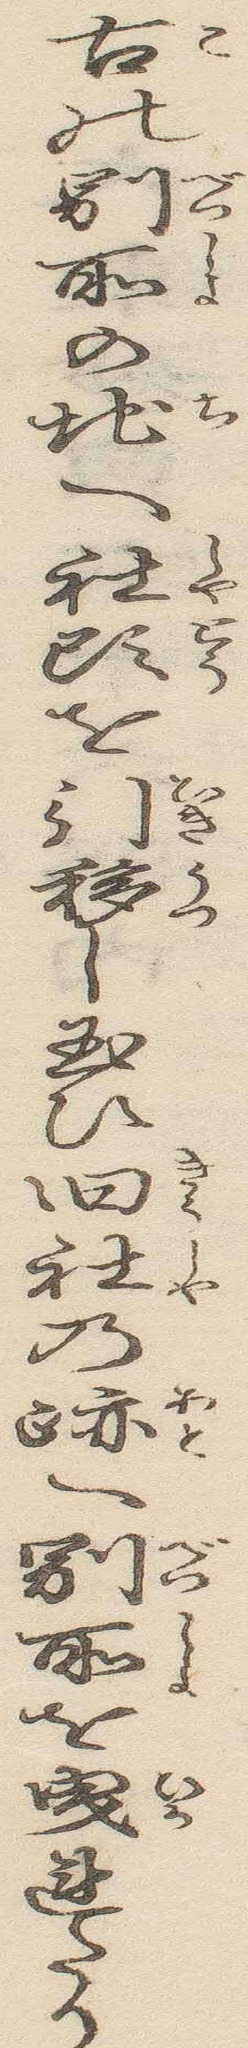古の別所の地へ社頭を引移し玉ひ旧社の跡へ別所を曳れたり
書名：日光山志
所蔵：東京学芸大学附属図書館 国文学研究資料館
